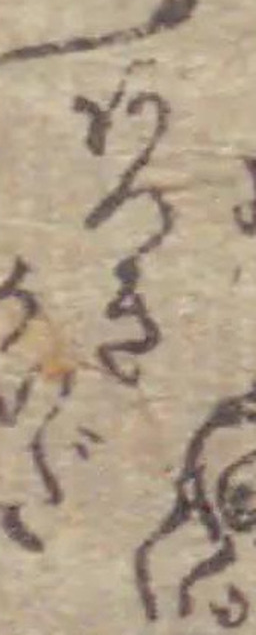あつき
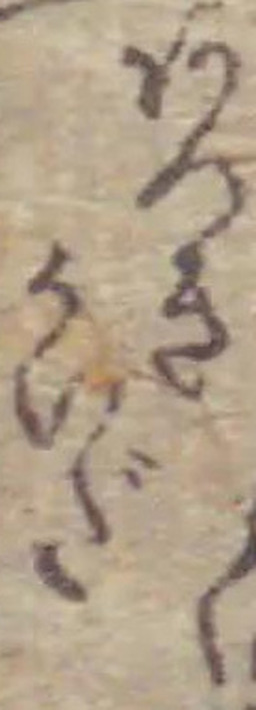かいだ

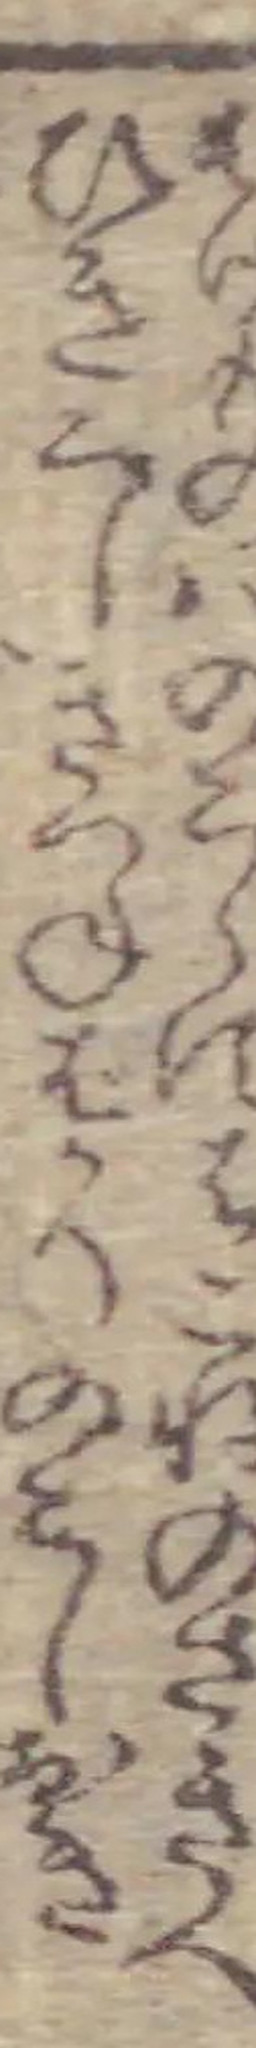ひきこしきつねばかりのこしおき
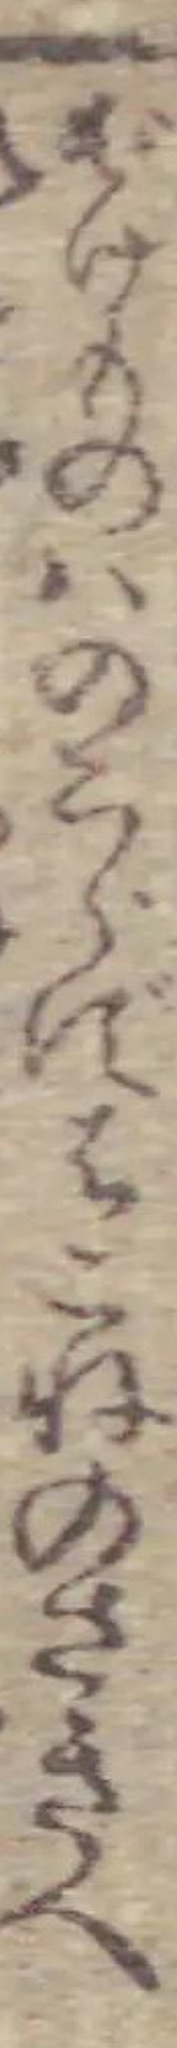ばけものはのこらずはこねのさきへ
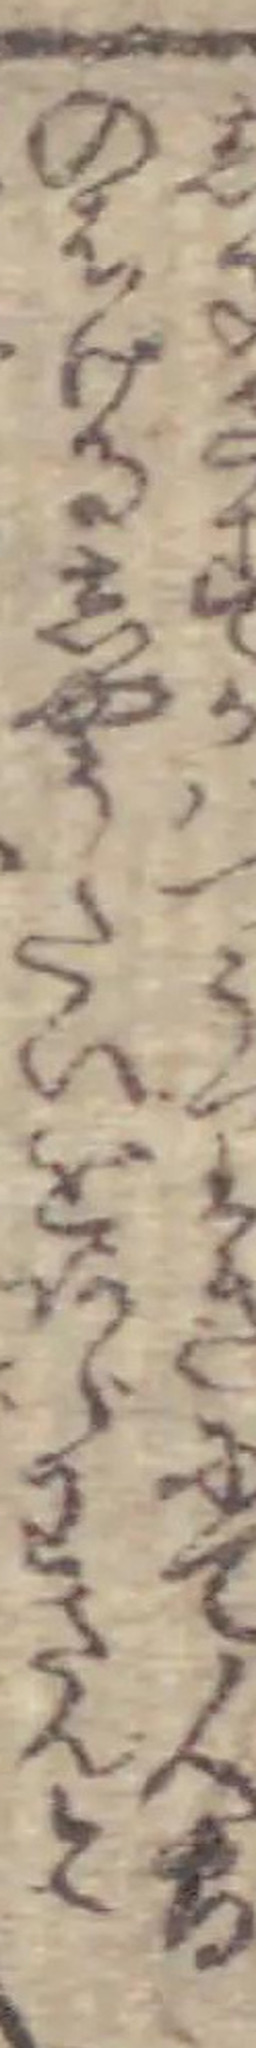のはけるしやうたいをあらわさんと
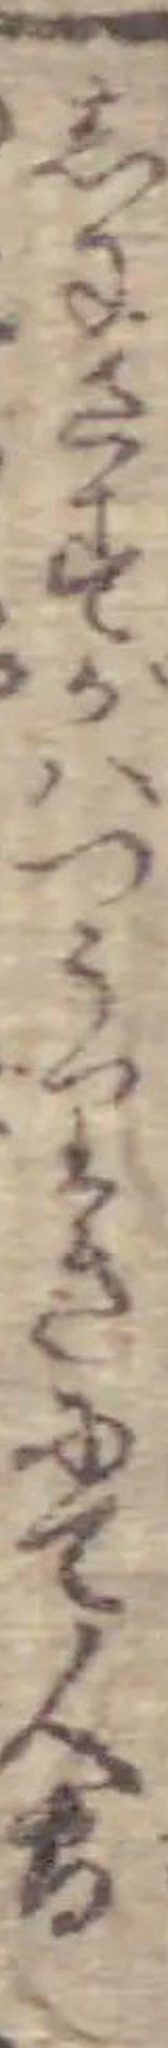しにさすがはつうつはきにて人間
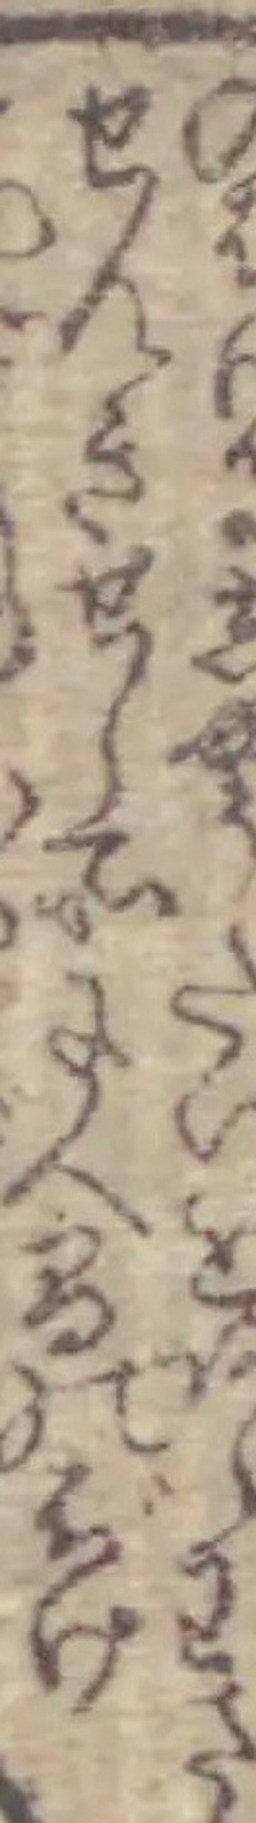せんきせし所に人間のばけ
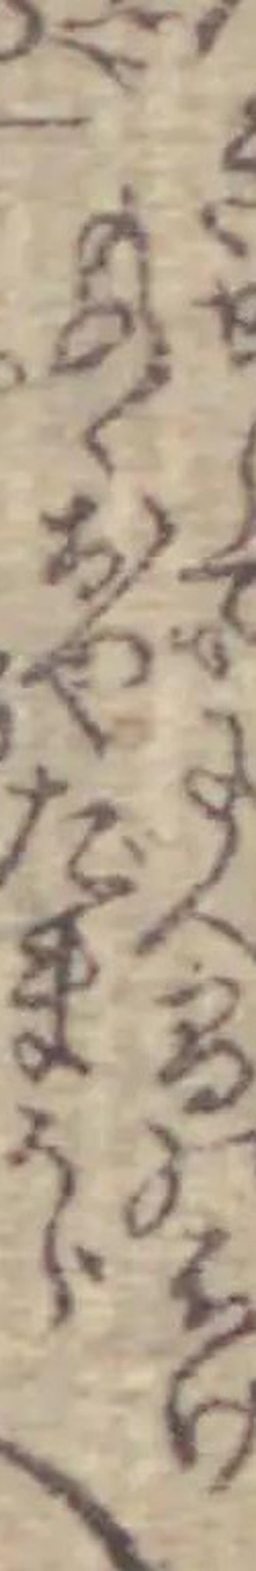ものゝおやだまうら
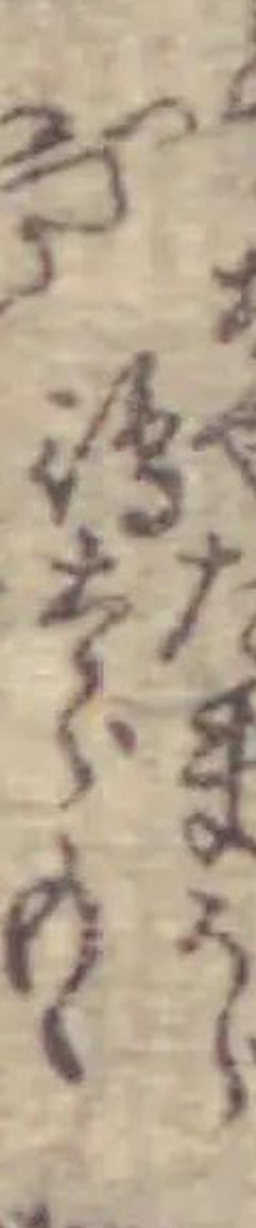嶋太郎もゝ
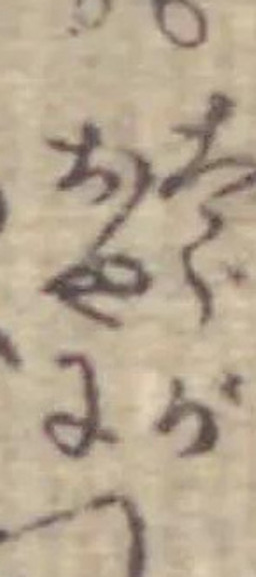おやに
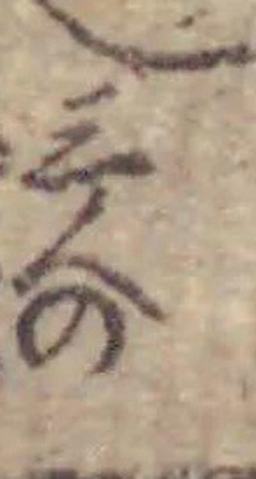三人の
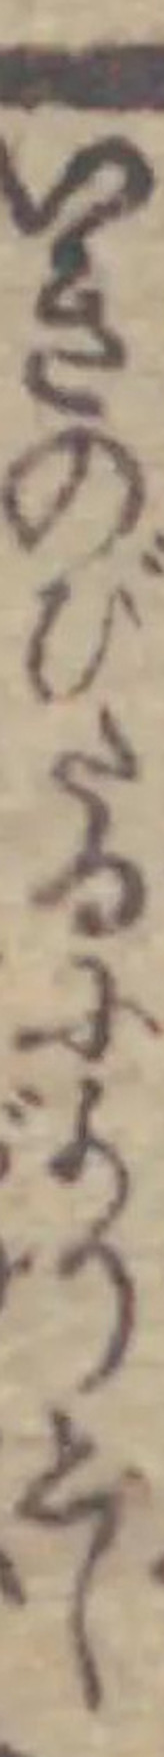いきのびたるによりとし
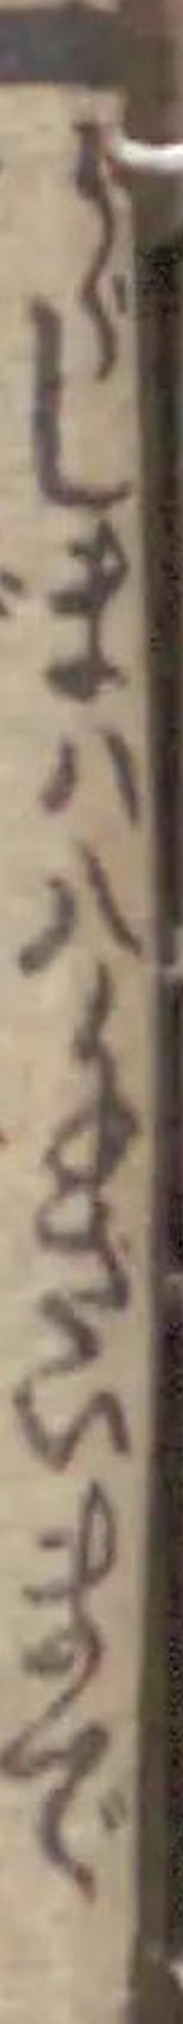うらしまは八千さいまで
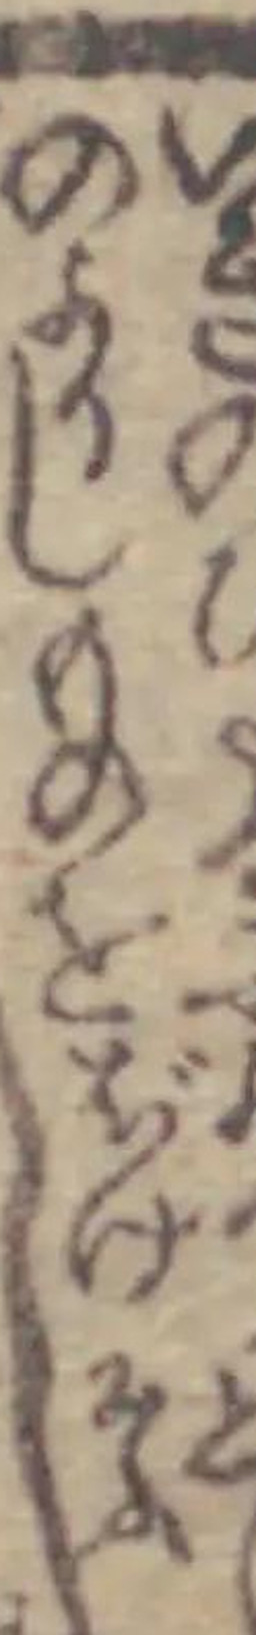のよりしものをばけそふ
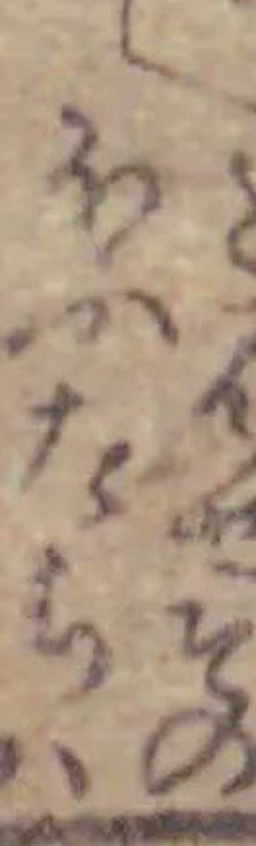ほふたちは
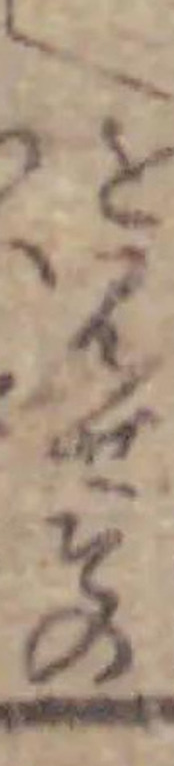をみせその
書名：化物箱根先 2巻
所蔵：国立国会図書館 National Diet Library, JAPAN
